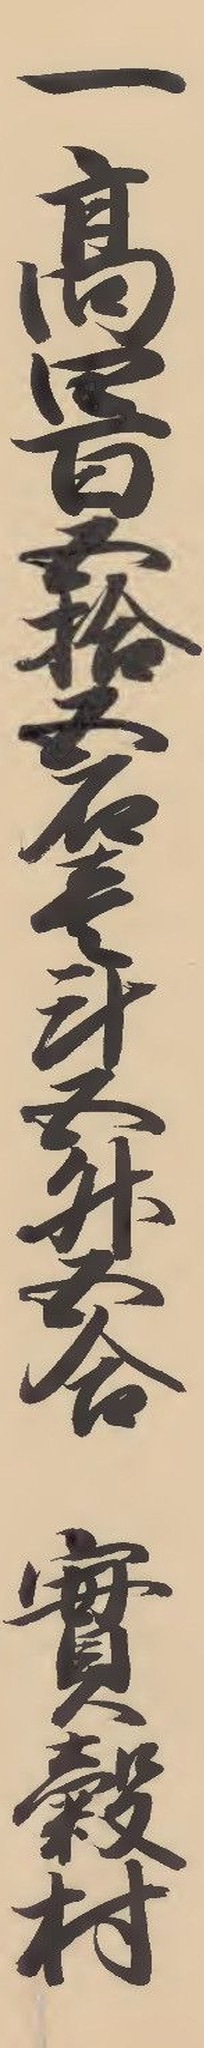一高四百五拾五石壱斗五升五合実穀村
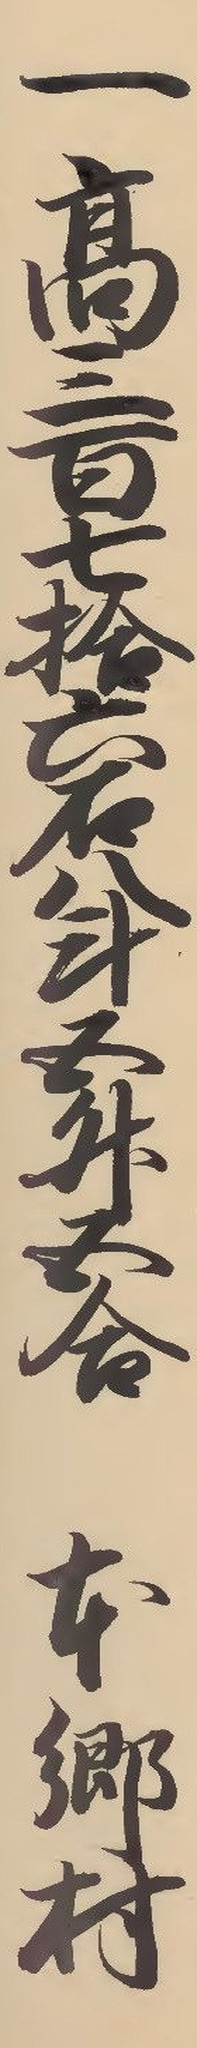一高三百七拾六石八斗五升五合本郷村
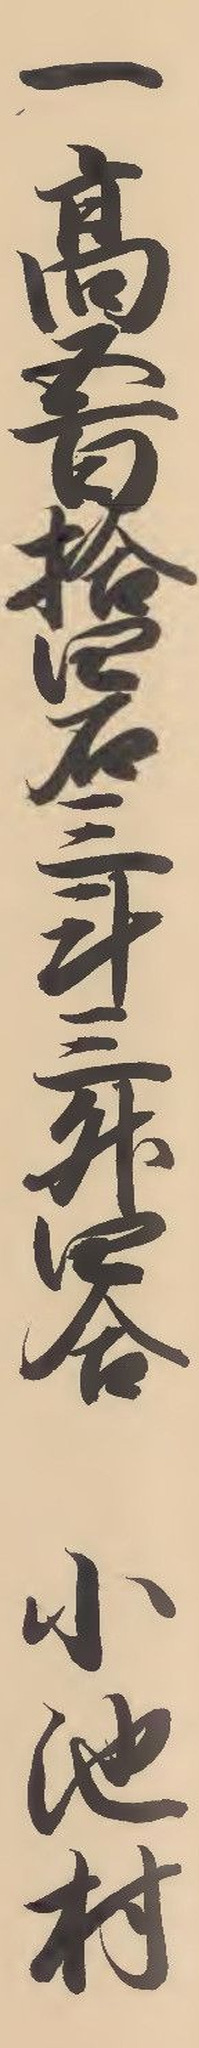一高五百拾四石三斗三升四合小池村
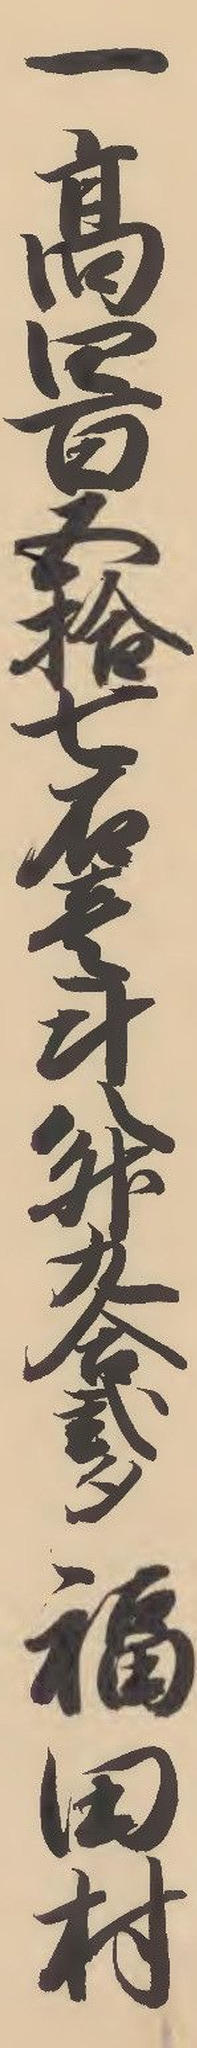一高四百五拾七石壱斗八升九合弐勺福田村
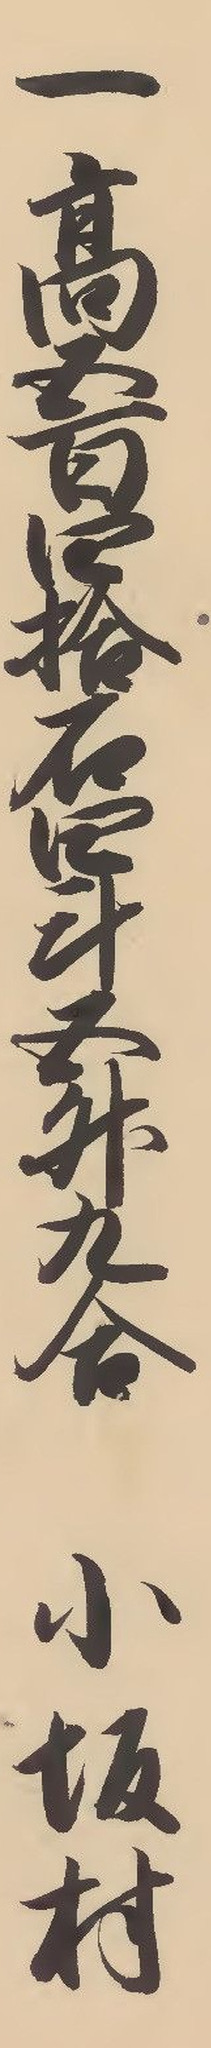一高五百四拾石四斗五升九合小坂村
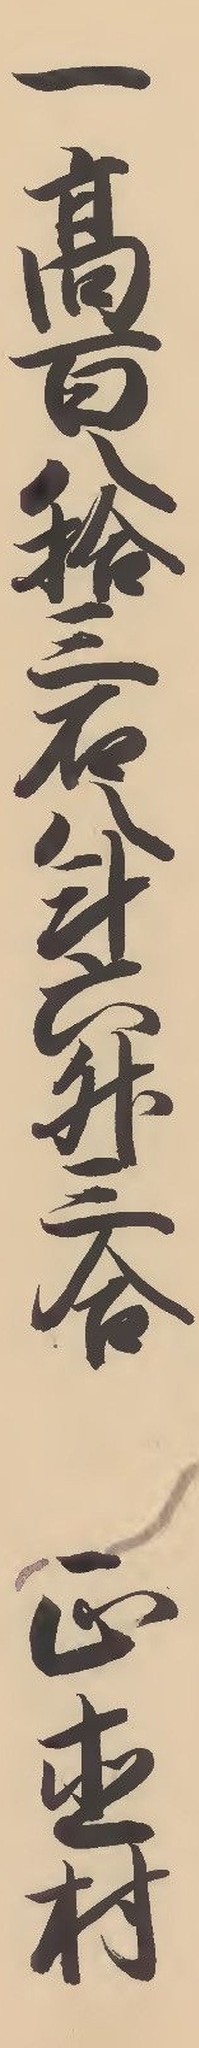一高百八拾三石八斗六升三合正直村

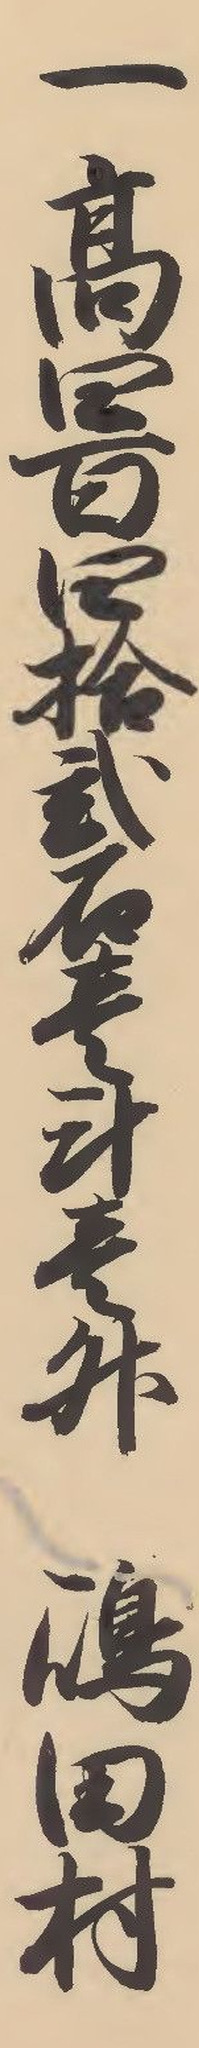一高四百四拾弐石壱斗壱升島田村
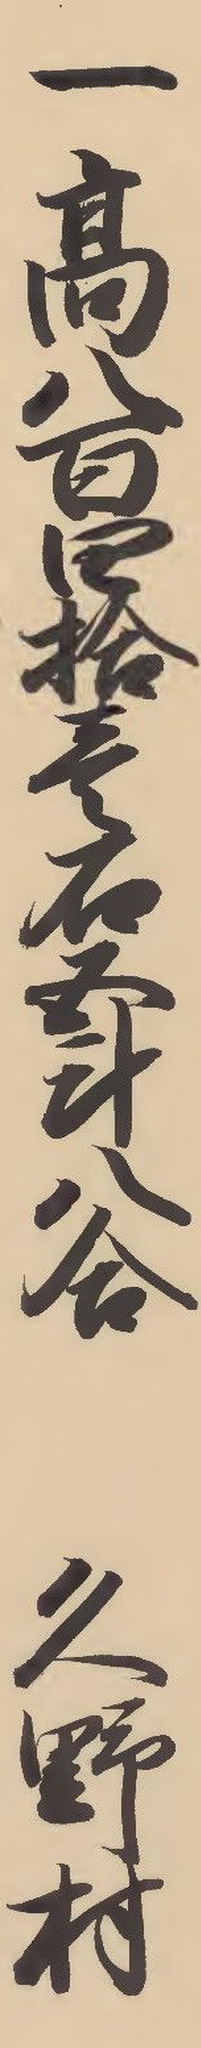一高八百四拾壱石五斗八合久野村
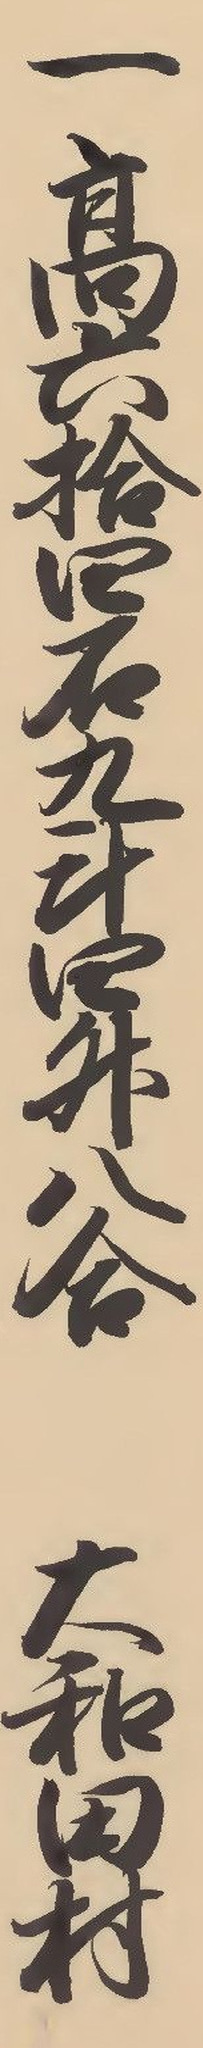一高六拾四石九斗四升八合大和田村
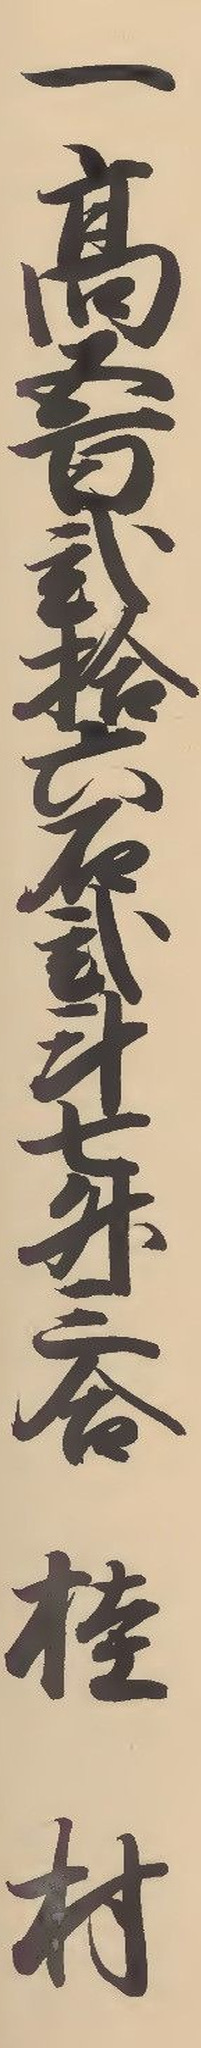一高五百弐拾六石弐斗七升三合桂村
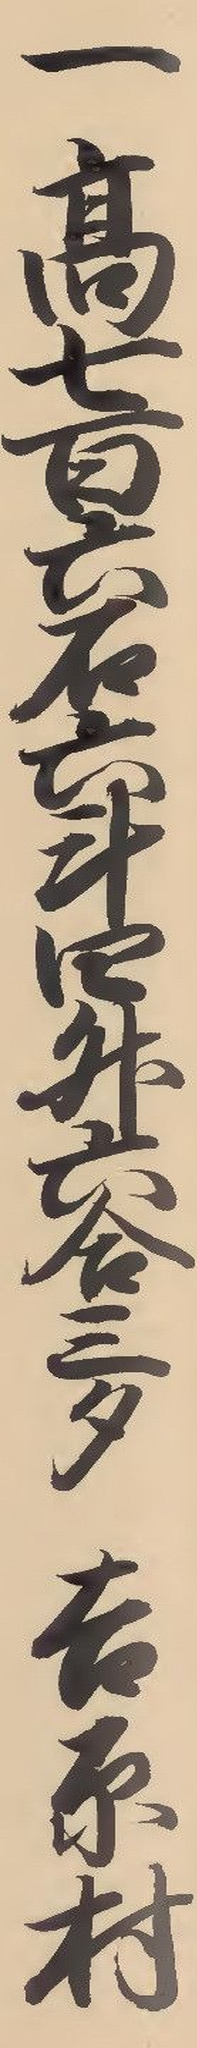一高七百六石六斗四升六合三勺吉原村
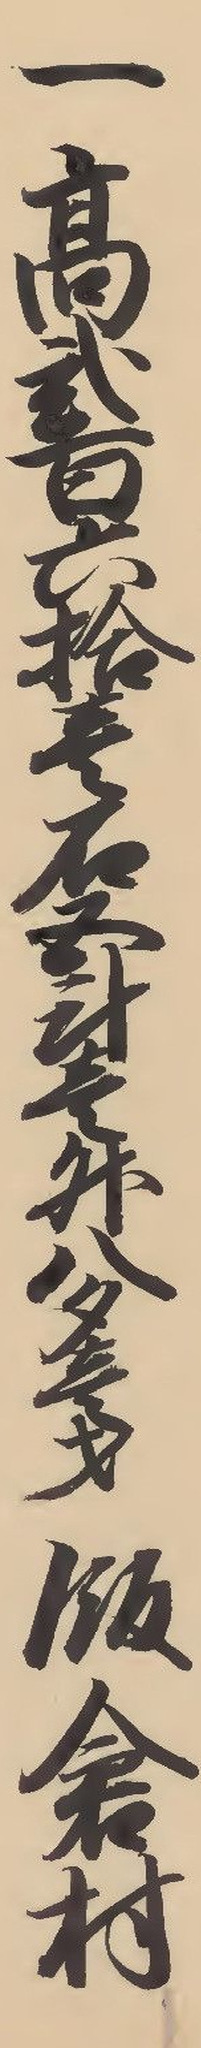一高弐百六拾壱石五斗壱升八勺壱才飯倉村
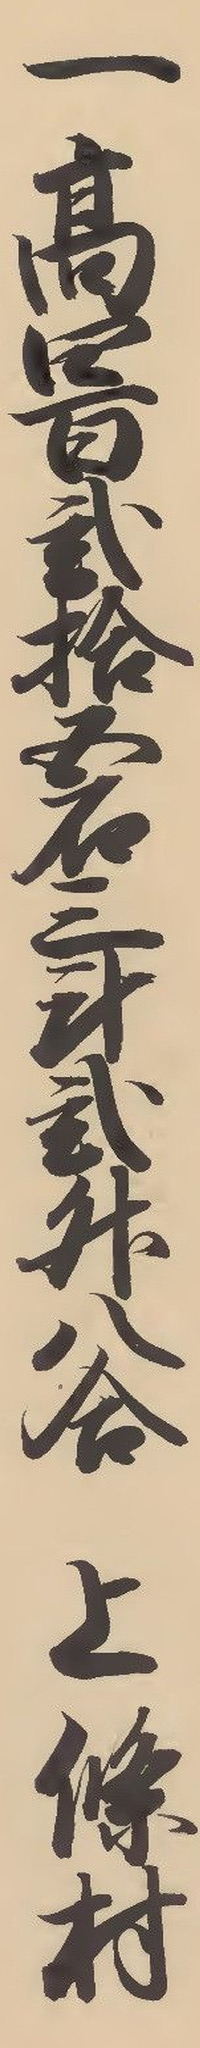一高四百弐拾五石三斗弐升八合上条村
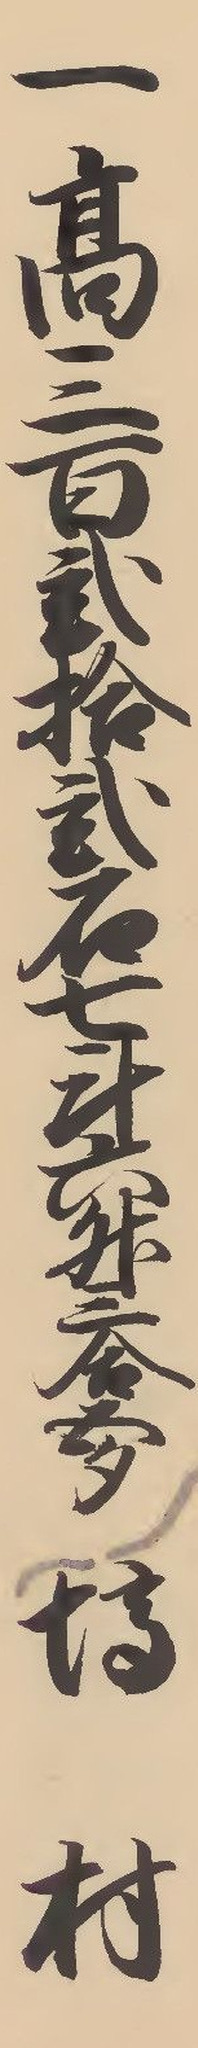一高三百弐拾弐石七斗六升三合五勺塙村

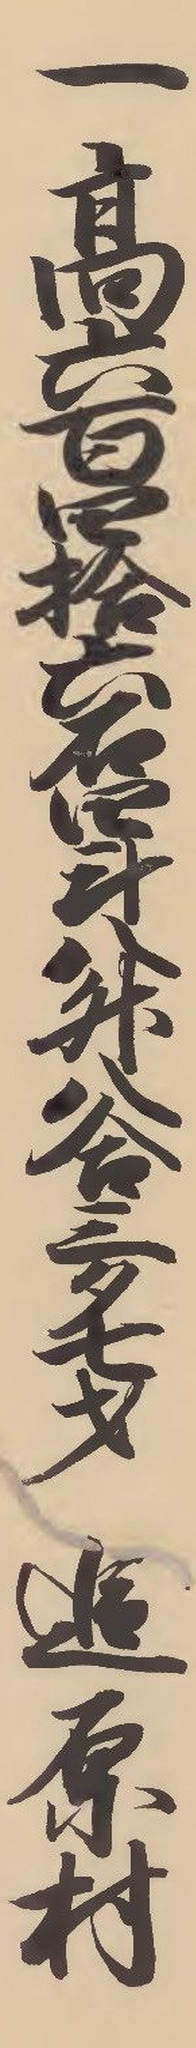一高六百四拾六石四斗八升八合三勺七才追原村
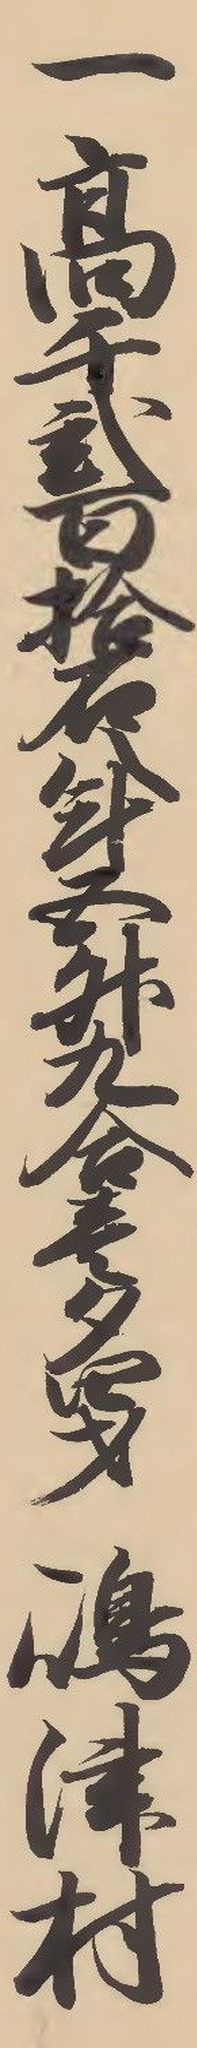一高千弐百拾石八斗五升九合壱勺四才島津村
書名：常陸国郷帳
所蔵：国立公文書館 National Archives of Japan
